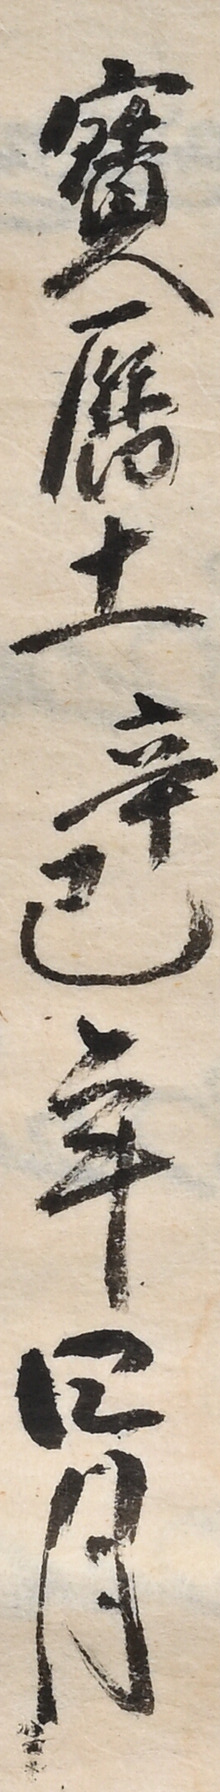宝暦十一辛巳年四月
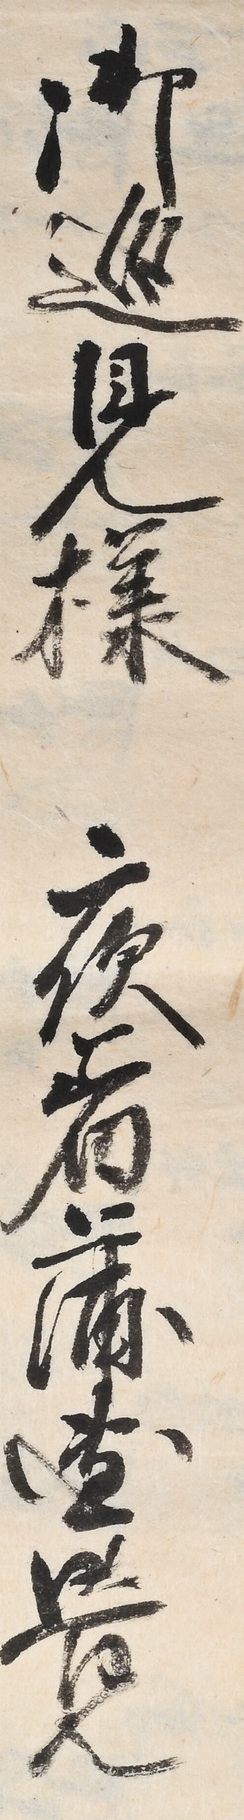御巡見様夜着蒲団覚
